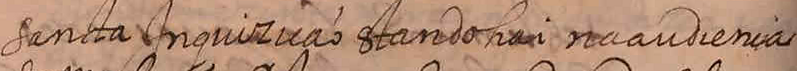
Sancta Jnquizicaõ estando hai na audiencia
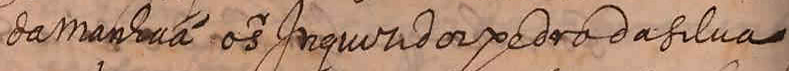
da manhaā o sr Jnquizidor pedro da silua
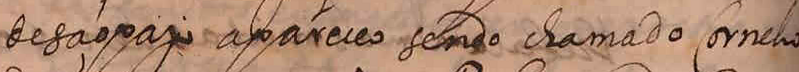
de saõpayo apareceo sendo chamado Cornelio
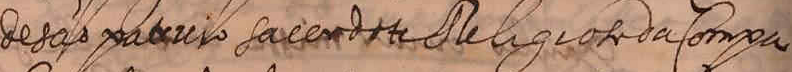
de saõ patricio sacerdote Religioso da Compa
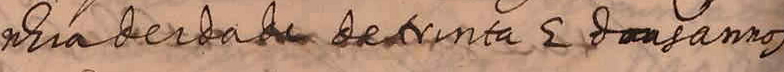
nhia de idade de trinta E dous annos
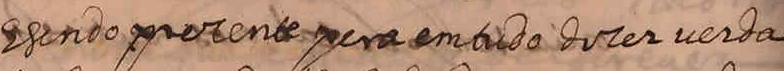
E sendo prezente pera em tudo dizer uerda
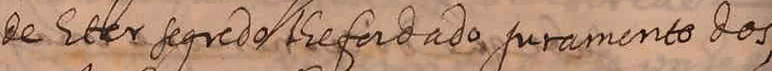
de E ter segredo lhe foi dado juramento dos
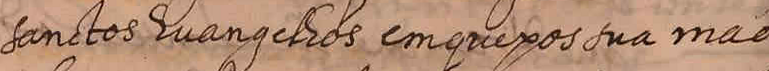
sanctos Euangelhos em que pos sua maõ
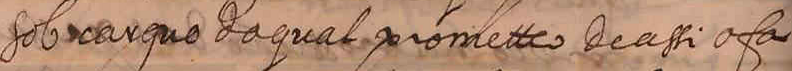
sob carguo do qual prometteo de assi o fa
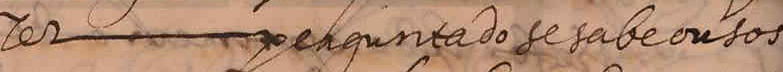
zer _______ perguntado se sabe ou sos
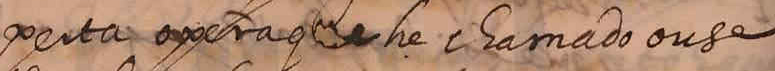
peita o pera que he chamado ou se
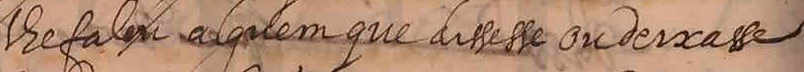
lhe falou alguem que dissesse ou deixasse
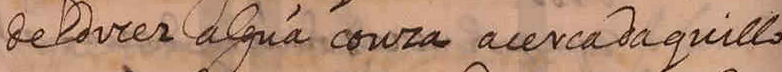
de dizer alguā couza acerca daquillo
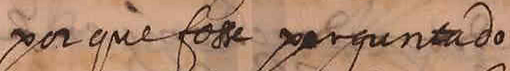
por que fosse perguntado
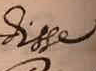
disse
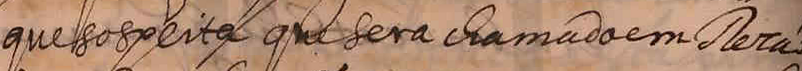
que sospeita que sera chamado em Rezaõ
